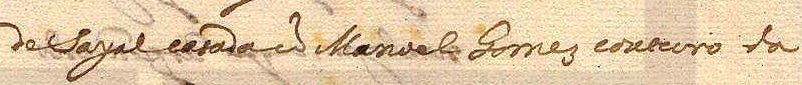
de Sayal casada cō Manoel Gomez couteiro da
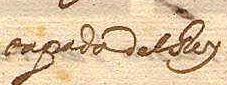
tapada del Rey
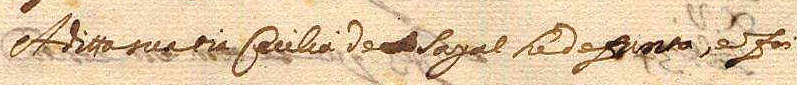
A ditta sua tia Cecilia de _Sayal he defunta, e foi
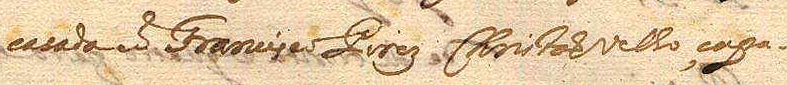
casada cō Francisco Pirez Christaõ velho çapa
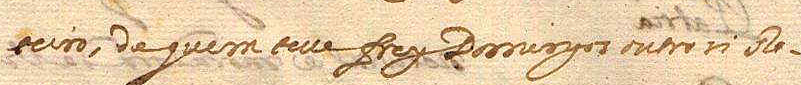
teiro, de quem teue frey Domingos outrosi Re
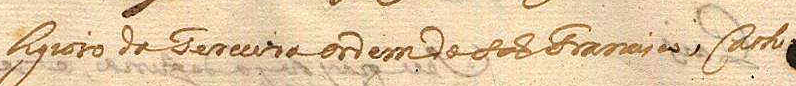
ligioso da Terceira ordem de são Francisco, Cathe
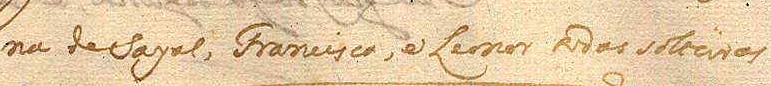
na de Sayal, Francisca, e Leonor todas solteiras
